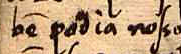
bē podia nosso
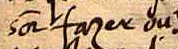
sōr fazer ou
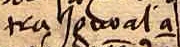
tra Jguoal a
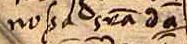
nossa sr̄a da
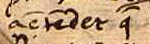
a ētēder q̄
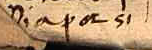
ia por si
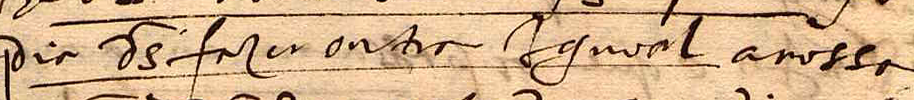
dia ds̄ fazer outra Iguoal a nossa
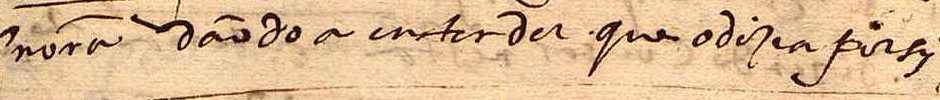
Snor̄a dãodo a entender que o dizia por sy
